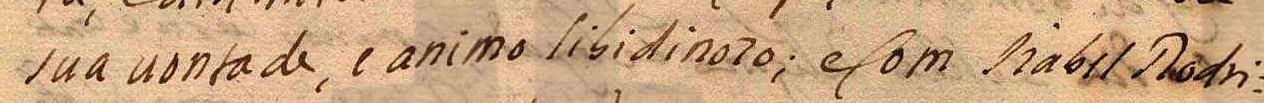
sua uontade, e animo libidinozo; e Com Izabel Rodri
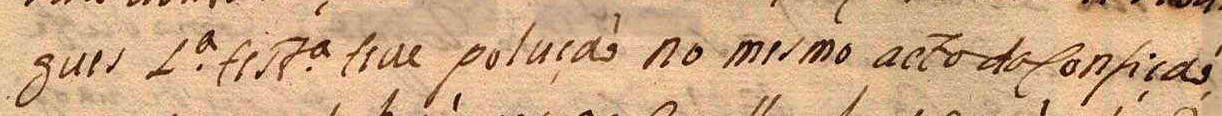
gues 1.a test.a teue polução no mesmo acto da Confiçaõ,
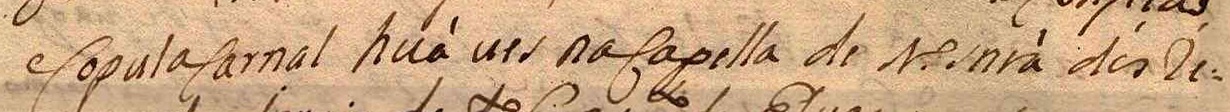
e Copula Carnal huā ues na Capella de N.o snrā dos Re
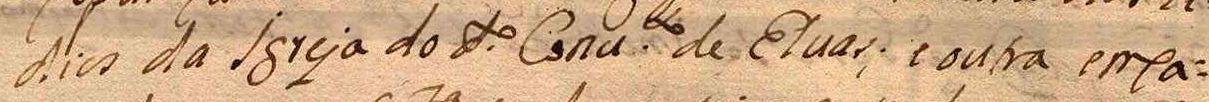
dios da Igreja do d̄.o Conu.to de Eluas; e outra em ca
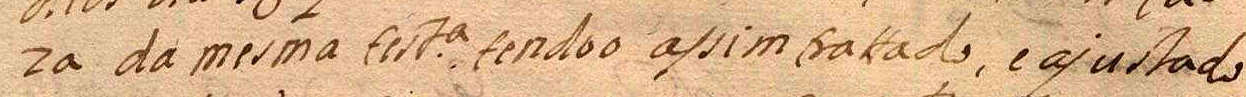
za da mesma test.a tendoo assim trattado, e ajustado
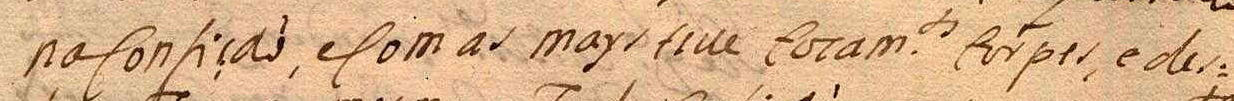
na Confiçaõ, e Com as mays teue tocam.tos torpes, e des
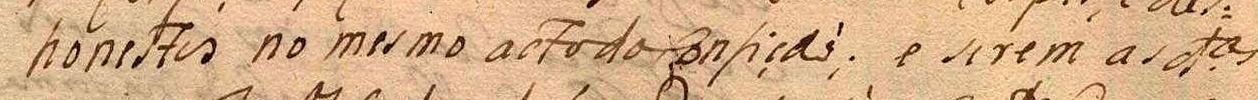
honestos no mesmo acto da Confiçaõ; e serem as d̄.as
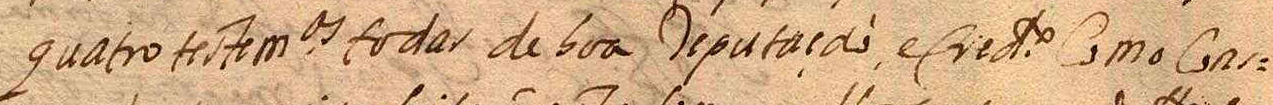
quatro testem.as todas de boa Reputaçaõ, e Cred̄.o Como Cons
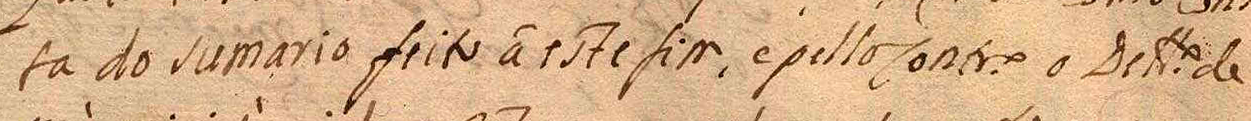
ta do sumario feito á este fim, e pello Contr.o o Delt.o de
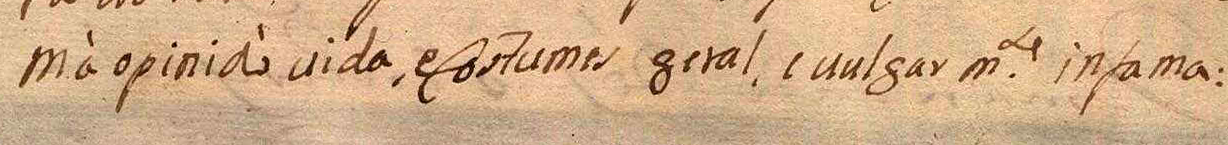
mà opinião uida, e Costumes geral, e uulgarm.te infama:
